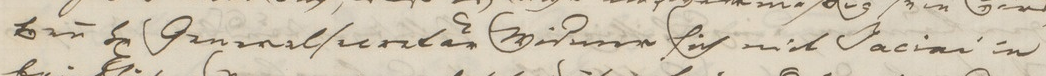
wenn Hr Generalsecretär Widmer sich mit Jacini in
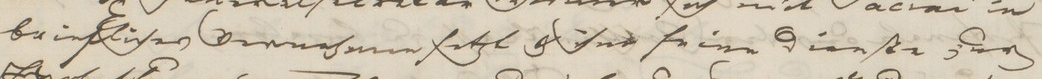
briefliches Vernehmen setzt & ihm seine Dienste zur
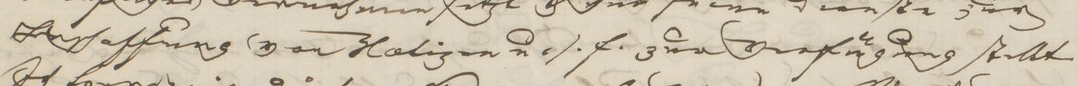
Beschaffung von Notizen u. s. f. zur Verfügung stellt.
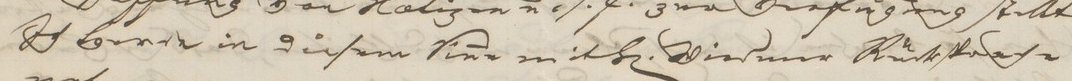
Ich werde in diesem Sinne mit Hrn. Wiedmer Rücksprache
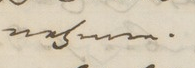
nehmen.
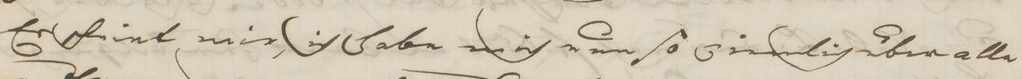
Es scheint mir, ich habe mich nun so ziemlich über alle
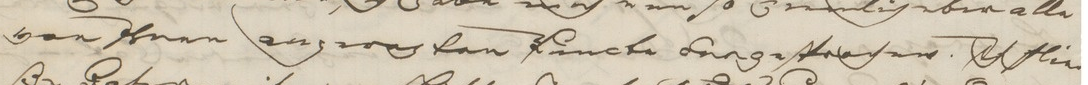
von Ihnen angeregten Puncte ausgesprochen. Ich schlie-
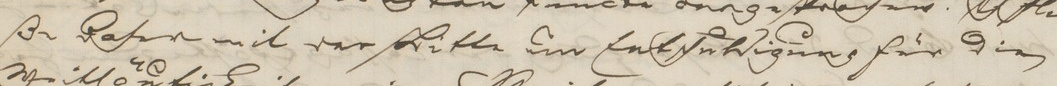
ße daher mit der Bitte um Entschuldigung für die
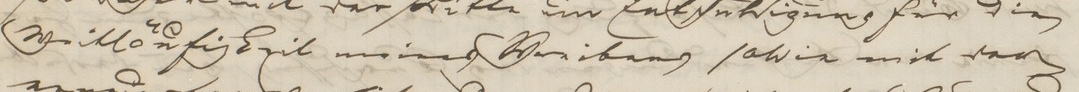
Weitläufigkeit meines Schreibens sowie mit der
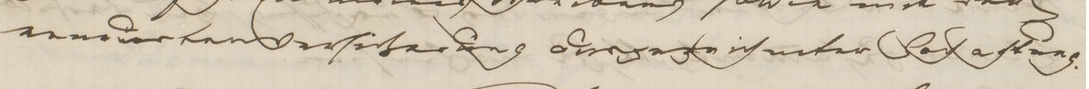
erneuerten Versicherung ausgezeichneter Hochachtung.
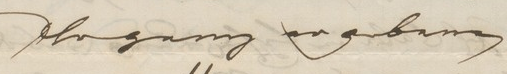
Ihr ganz ergebene
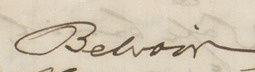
Belvoir
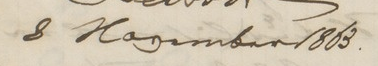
8 November 1863.
